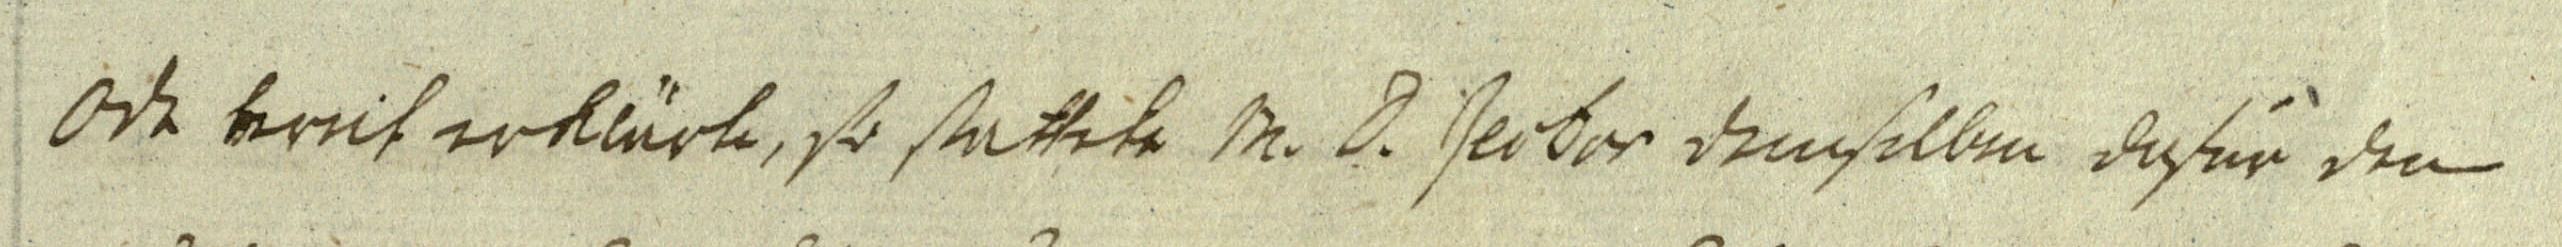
Ode bereit erklärte, so stattete M. D. Rector demselben dafür den
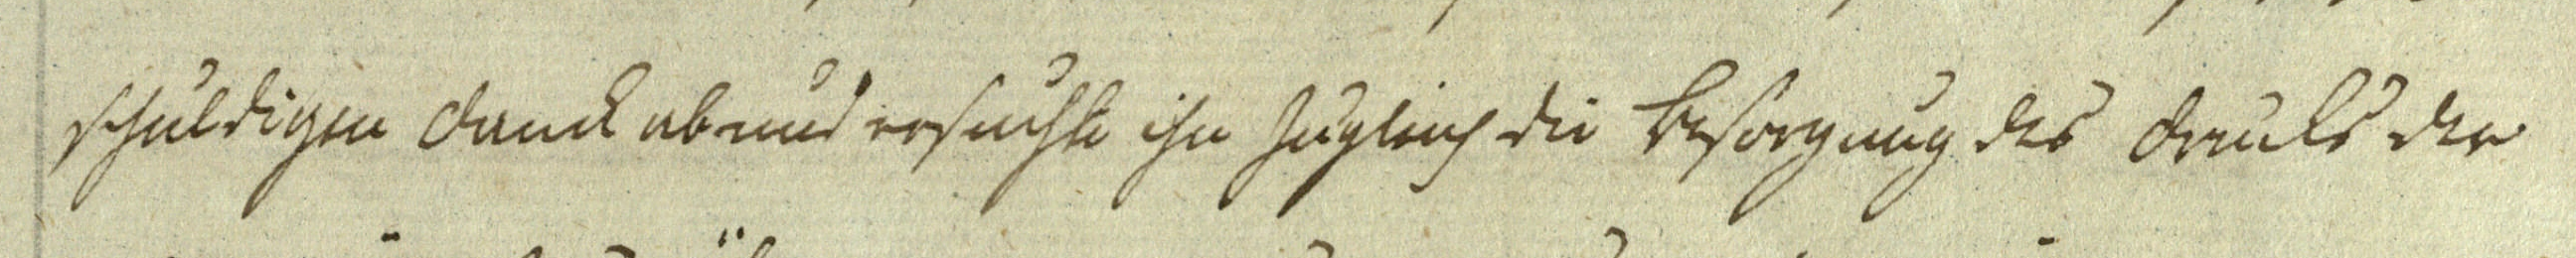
schuldigen Danck ab und ersuchte ihn zugleich die Besorgung des Drucks der
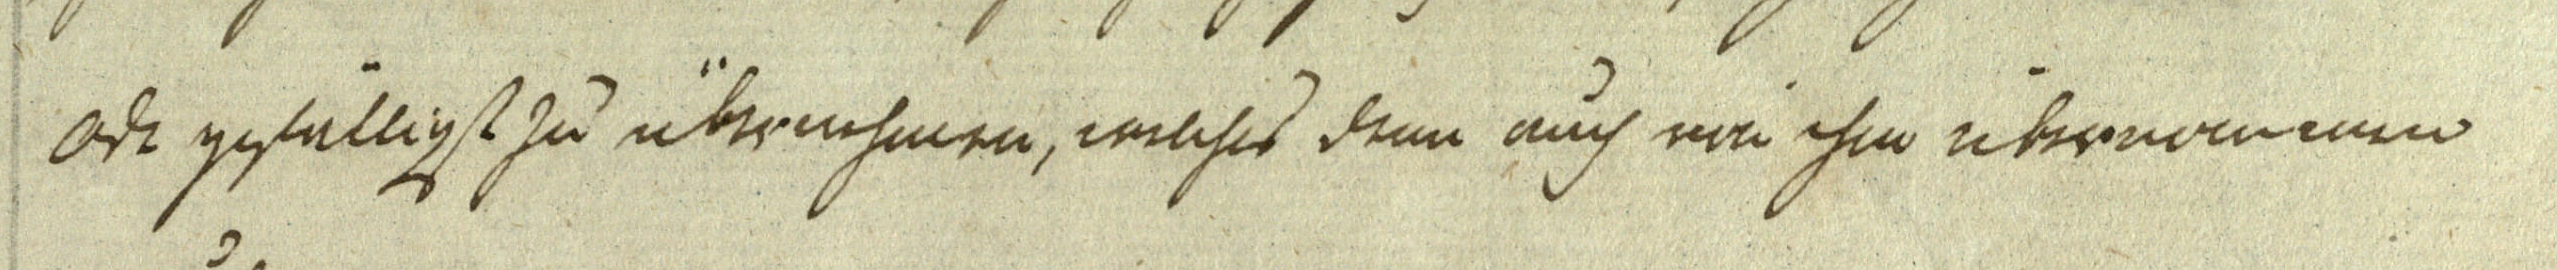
Ode gefälligst zu übernehmen, welches denn auch von ihm übernommen
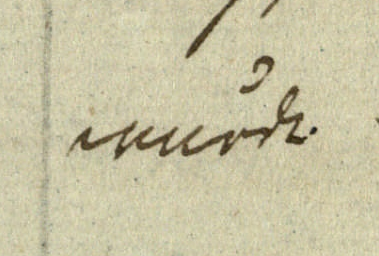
wurde.
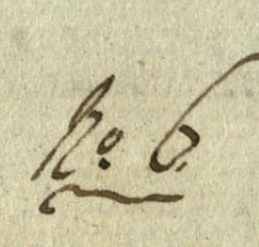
Nº 6.
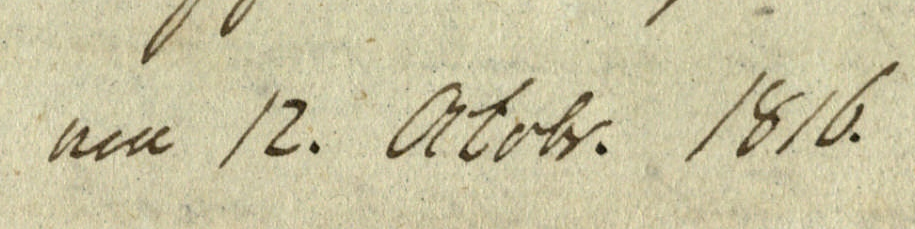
am 12. Octobr. 1816.
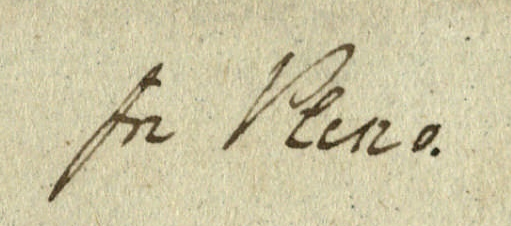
In Pleno.
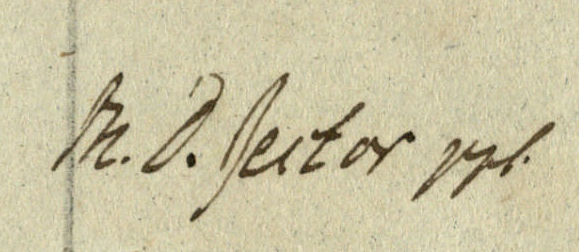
M. D. Rector ppt.
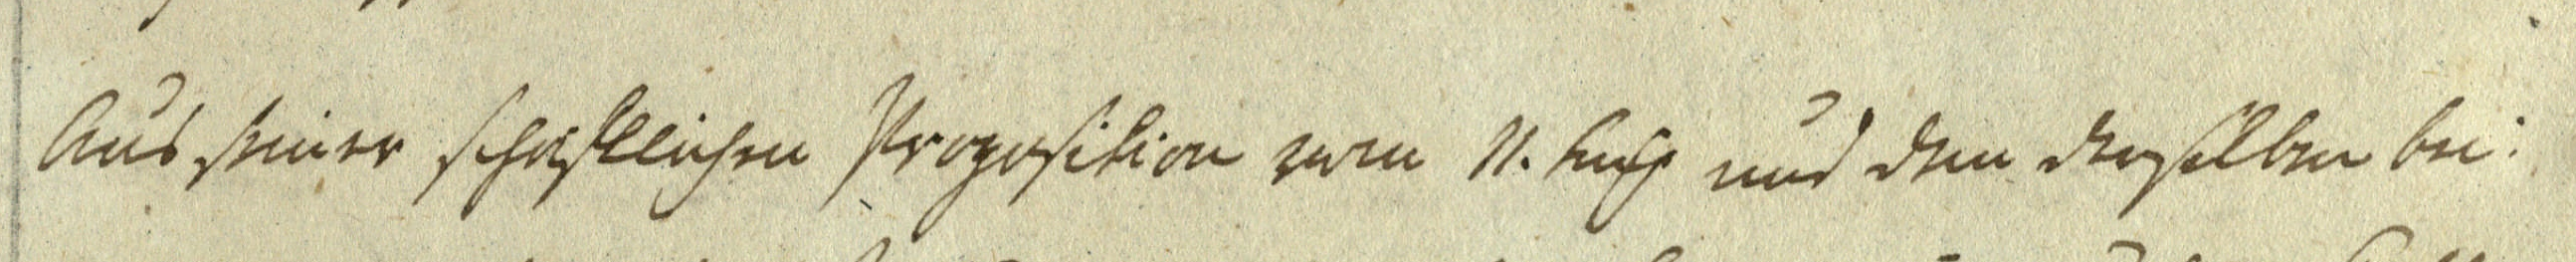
Aus seiner schriftlichen Proposition vom 11. huj und dem derselben be¬i
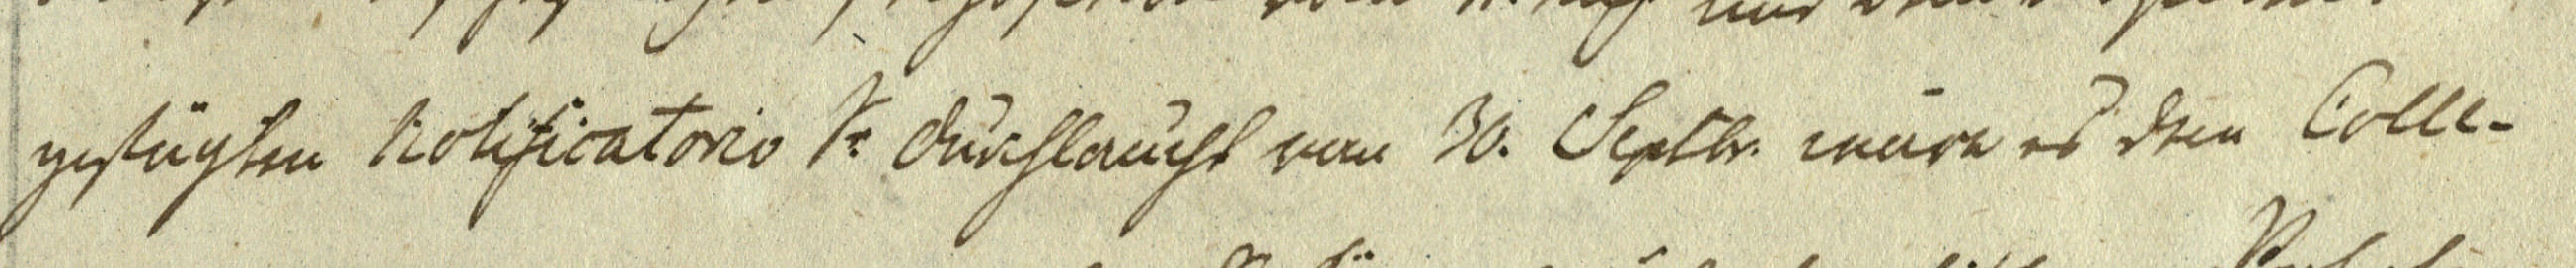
gefügten Notificatorio Sr. Durchlaucht von 30. Septbr. wäre es dem Colle¬
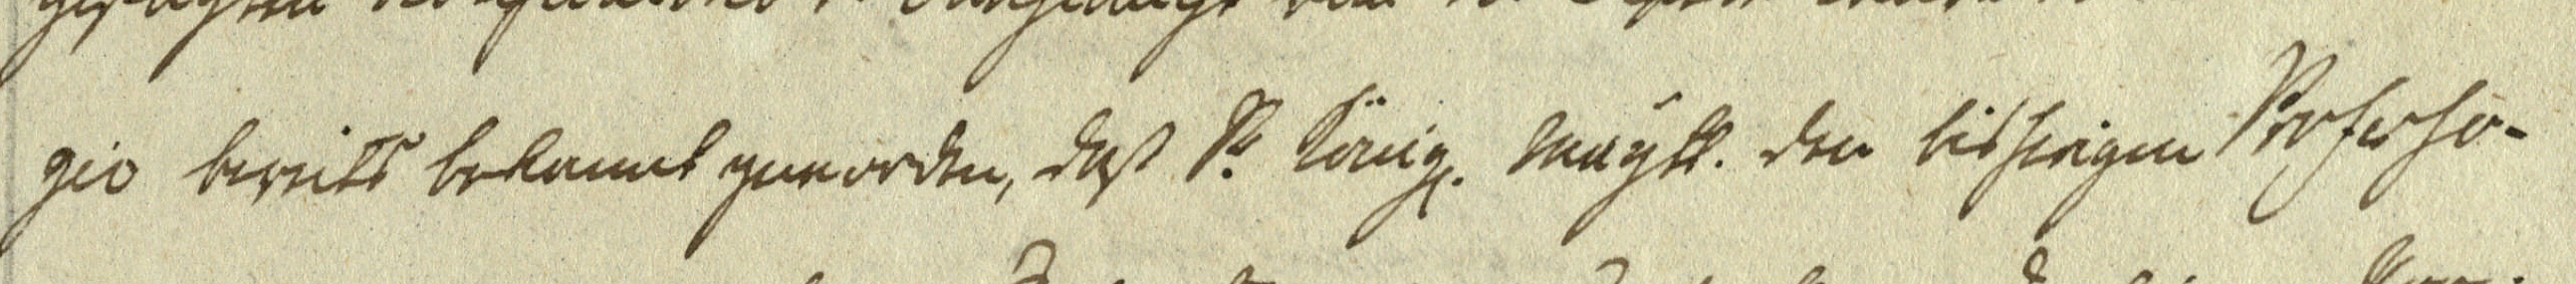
gio bereits bekannt geworden, daß Sr Königl. Maÿtt. den bisherigen Professo¬
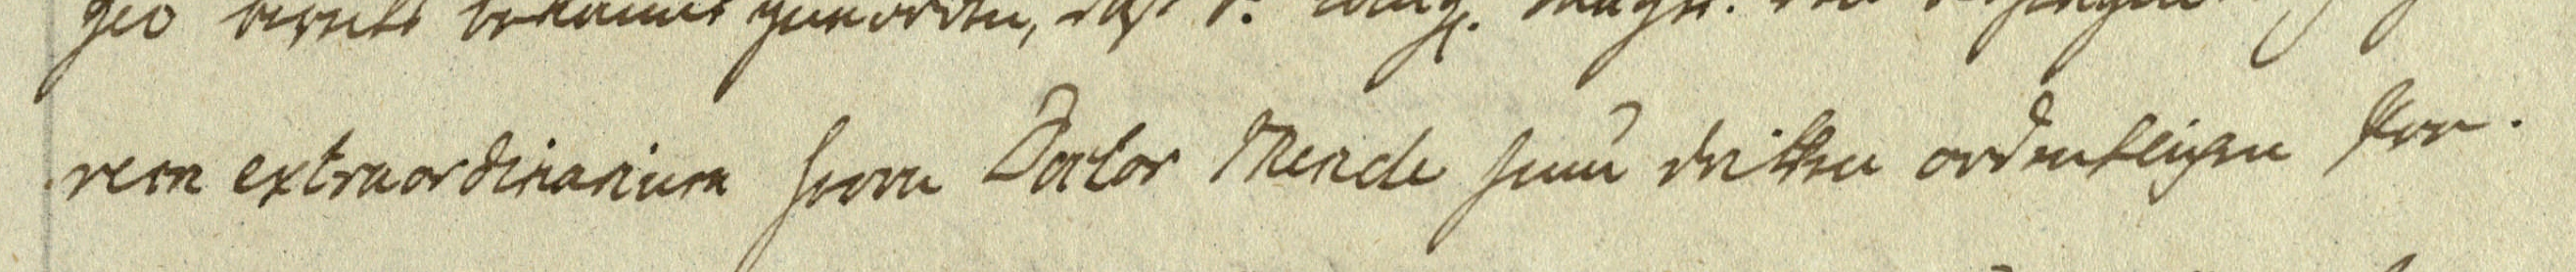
vemm extraordinarium Herrn Doctor Mende zum dritten ordentlichen Pro¬
